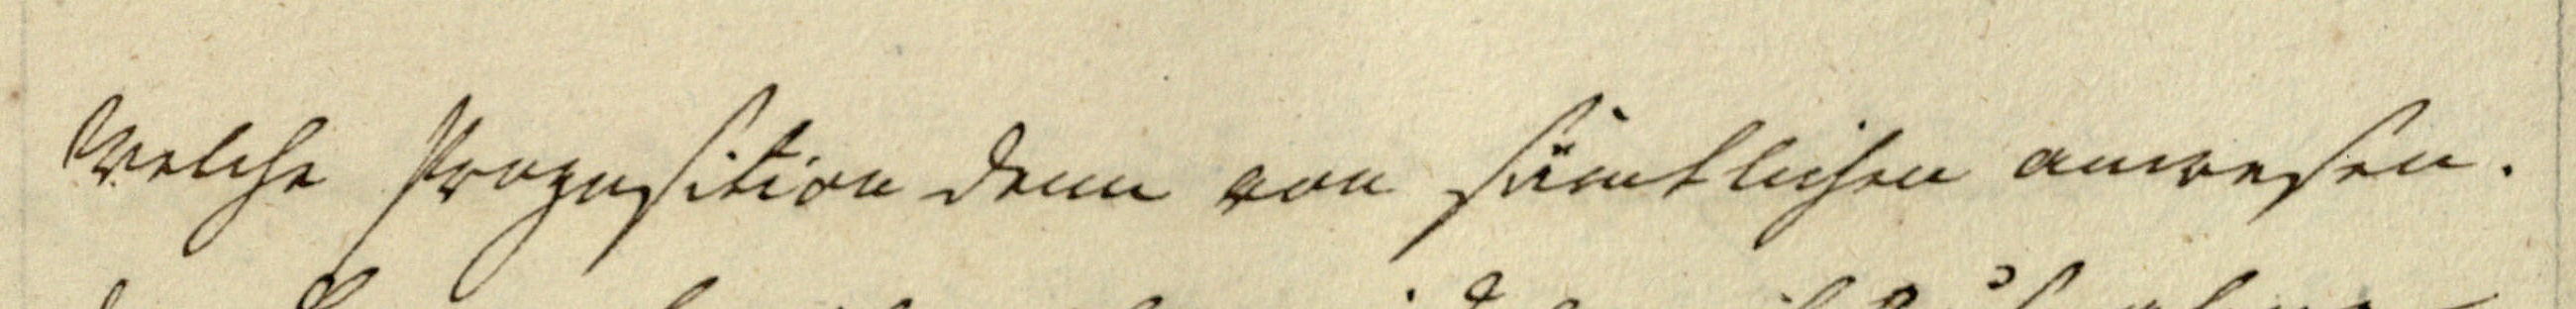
Welche Proposition denn von sämtlichen anwesen¬
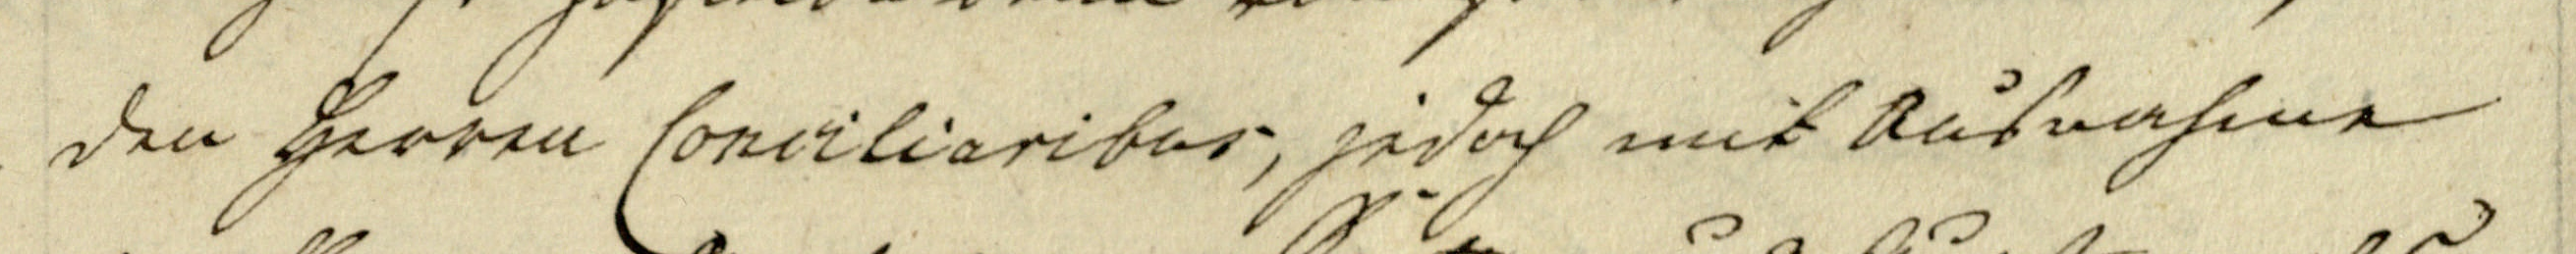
den Herren Conciliaribus, jedoch mit Aufnahme
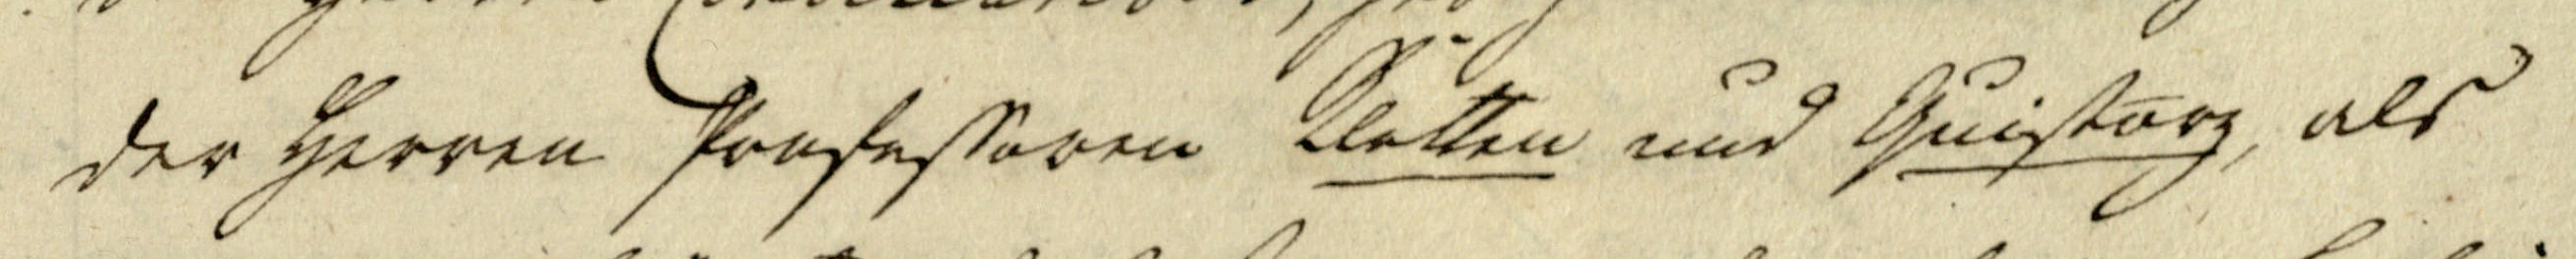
der Herren Professoren Kletten und Quistorp, als
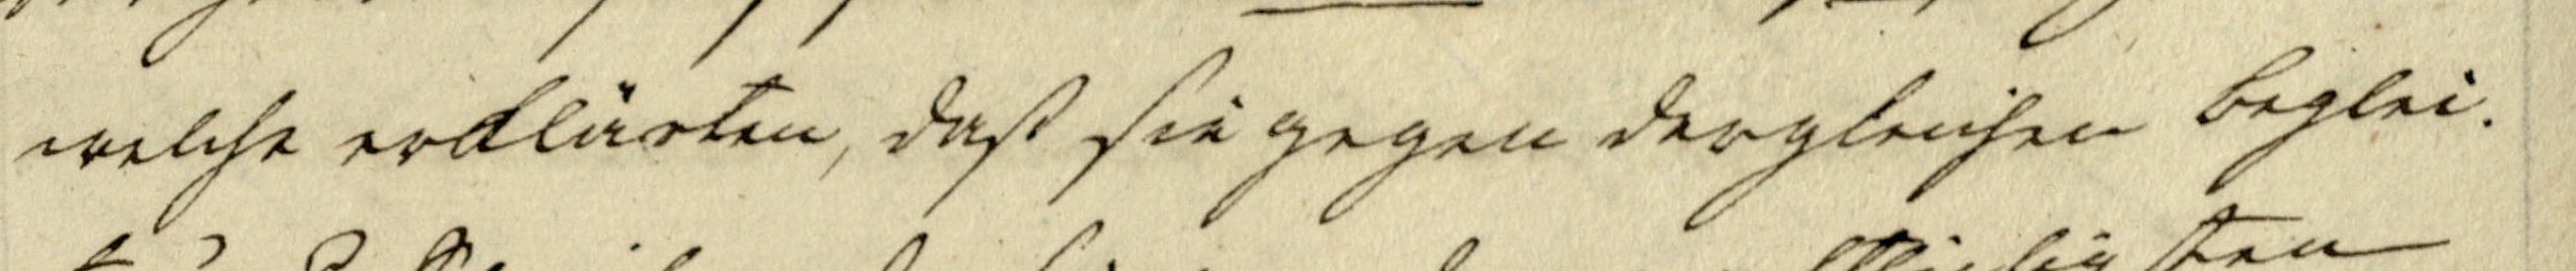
welche erklärten, daß sie gegen dergleichen Beglei¬
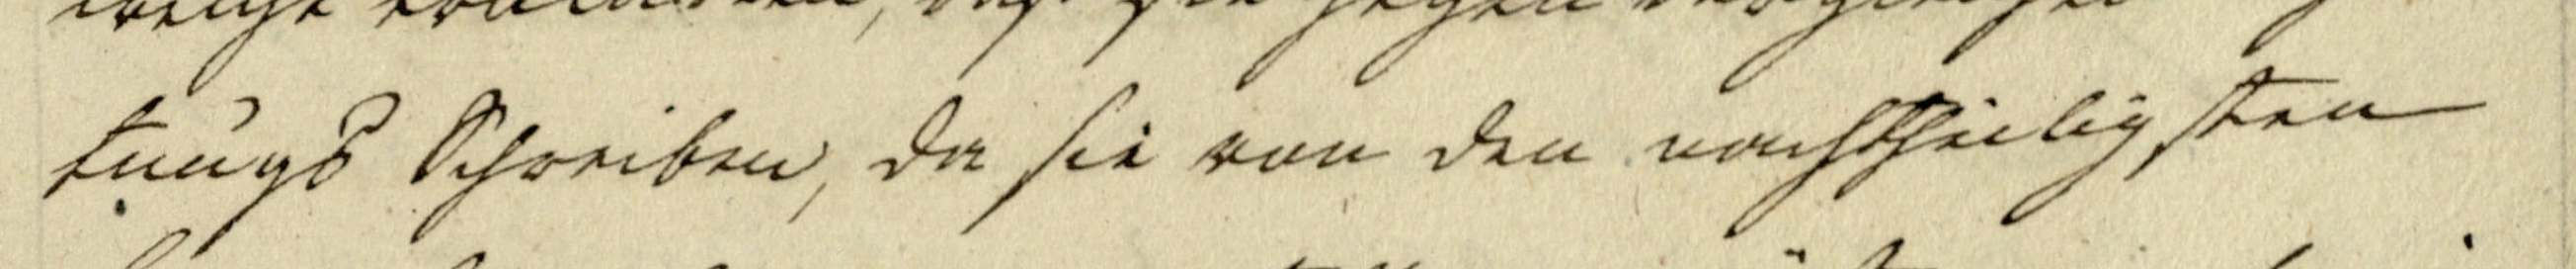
tungs Schreiben, da sie von den nachtheiligsten
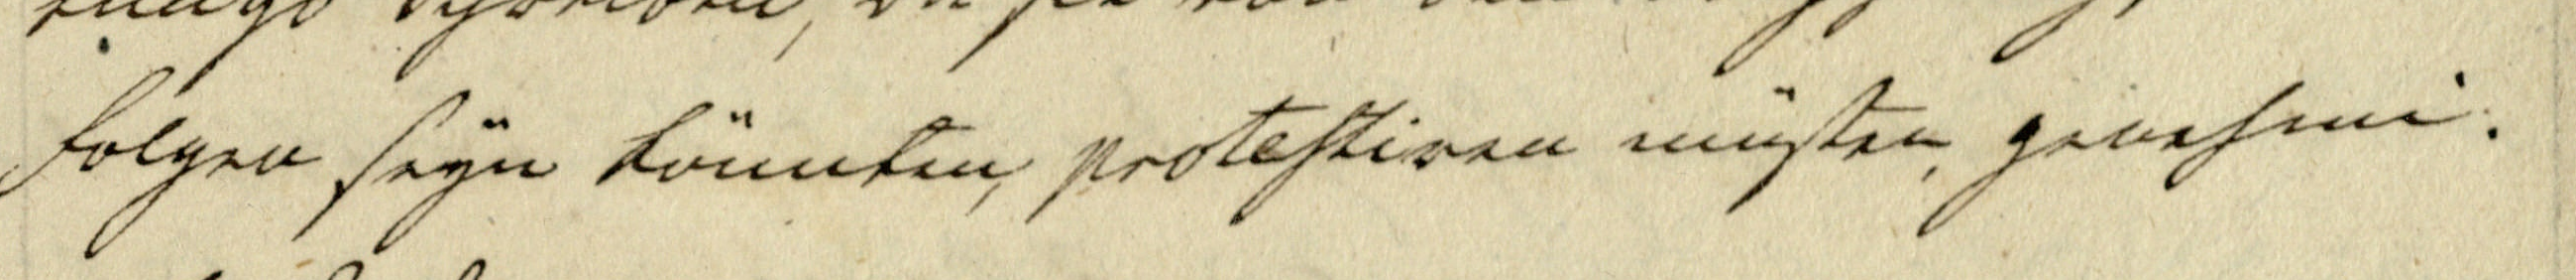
Folgen seÿn könnten, protestiren müßten, genehmi¬
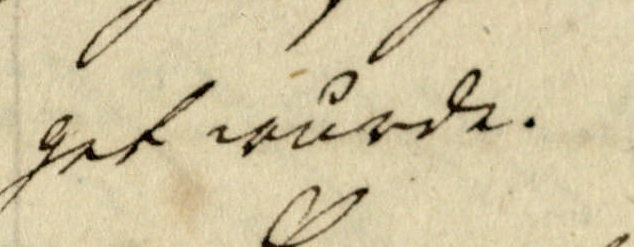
get wurde.
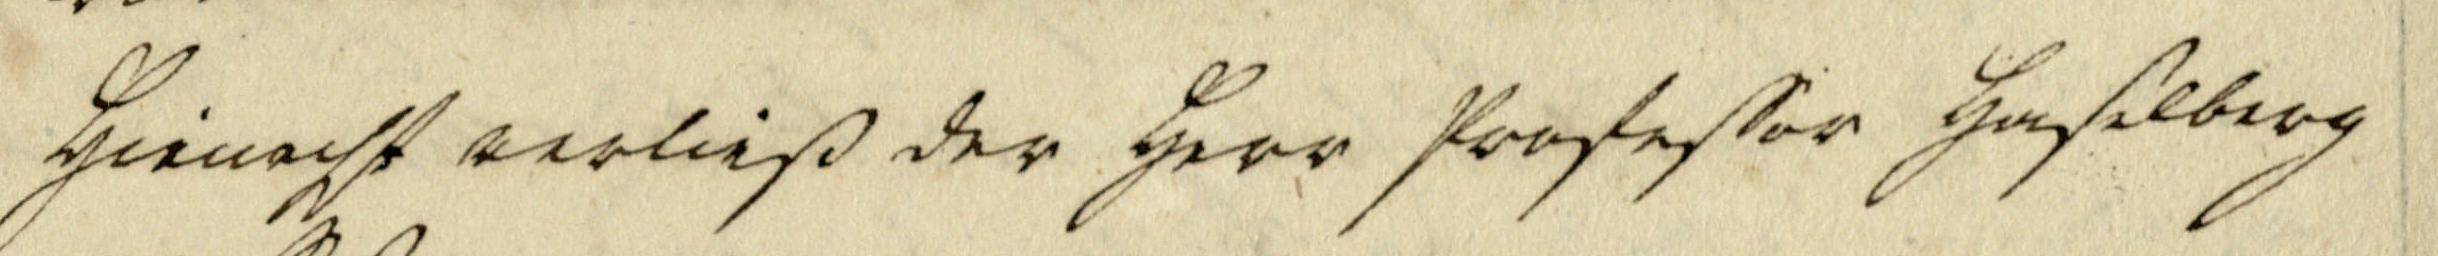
Hienechst verließ der Herr Professor Haselberg
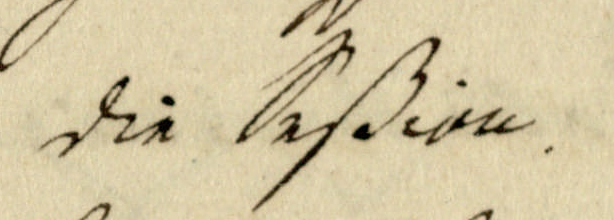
die Seßion.
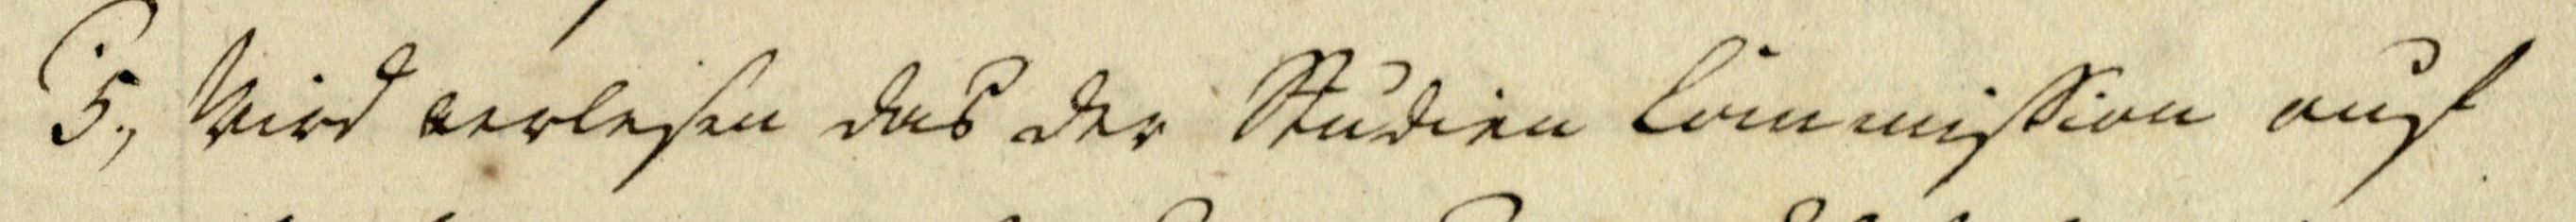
5., Wird verlesen das der Studien Commission auf
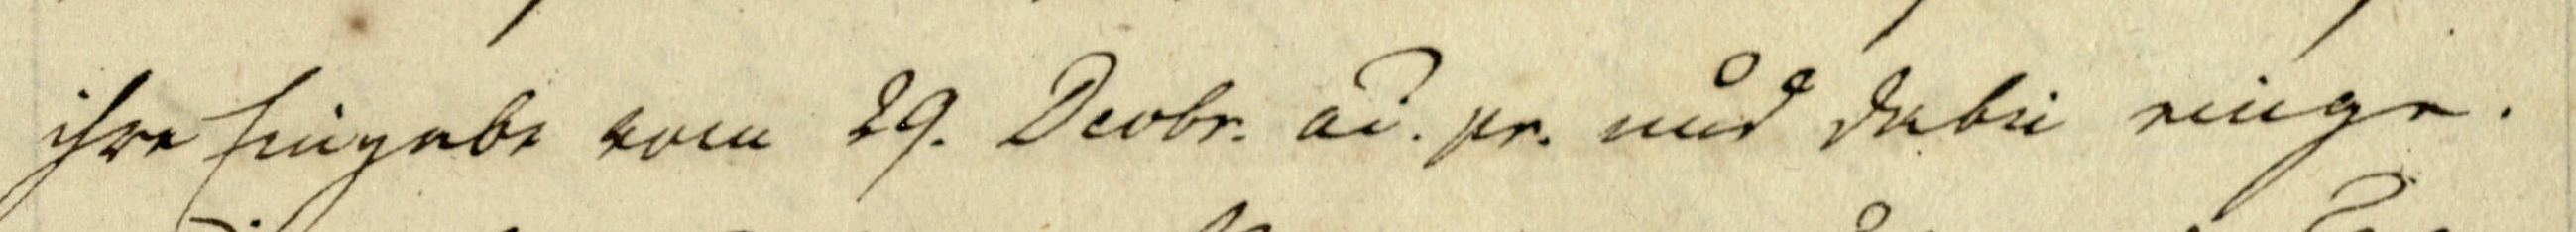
ihre Eingabe vom 29. Decbr. ai. pr. und dabei einge¬
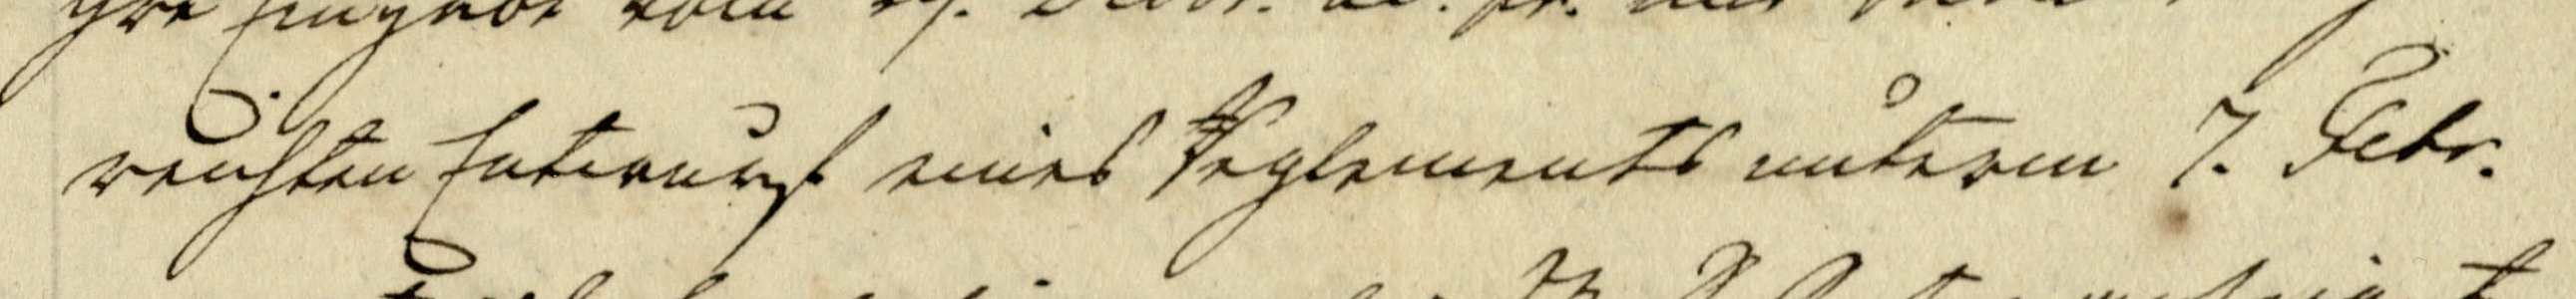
reichten Entwurf eines Reglements unterm 7. Febr.
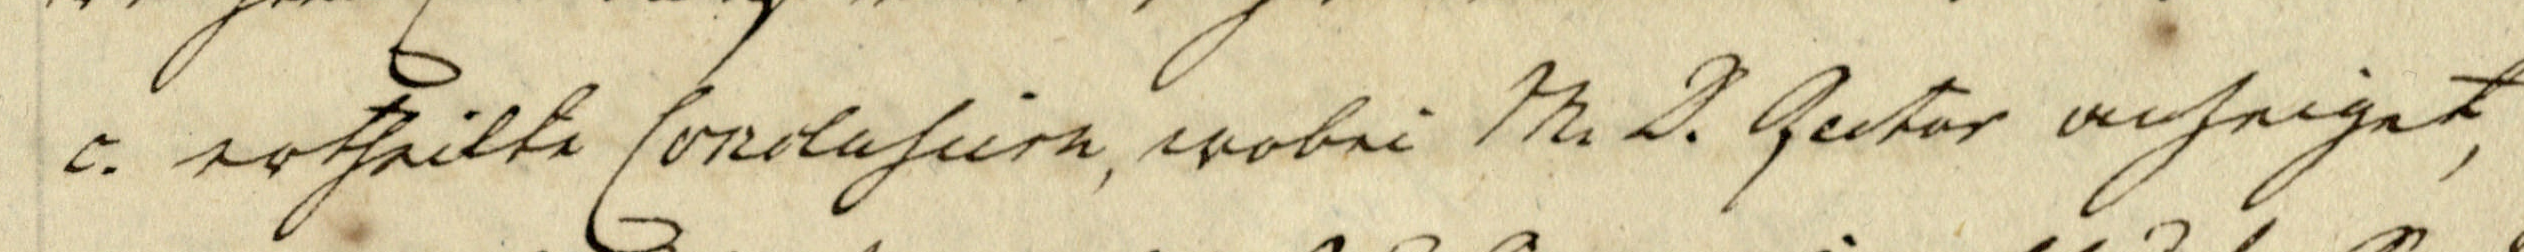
c. ertheilte Conclusum, wobei M. D. Rector anzeiget,
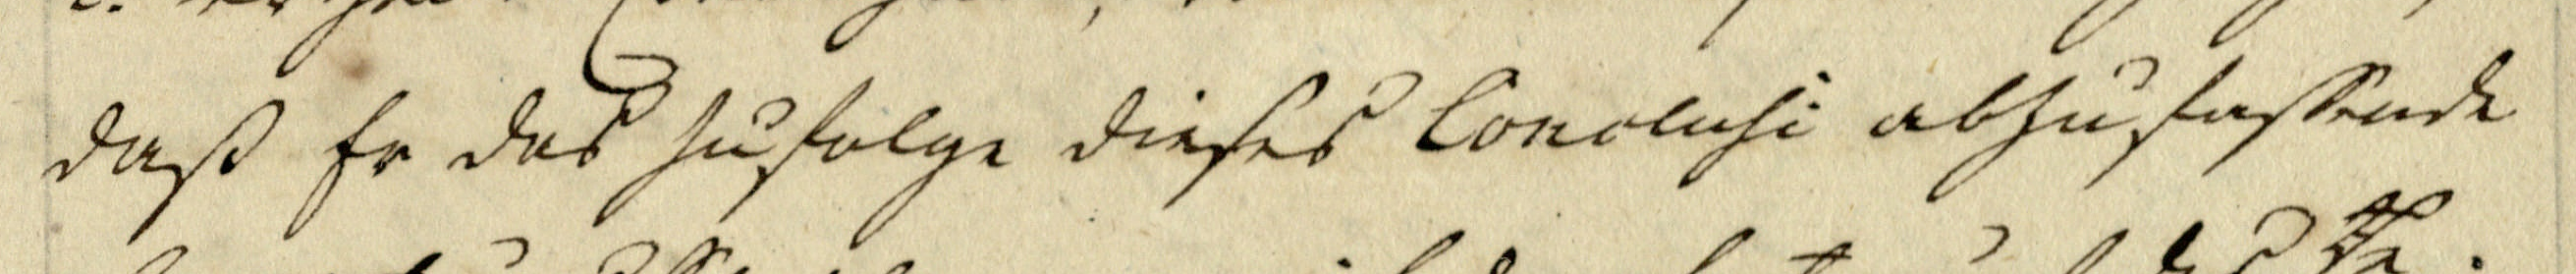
daß Er das zufolge dieses Conclusi abzufassende
